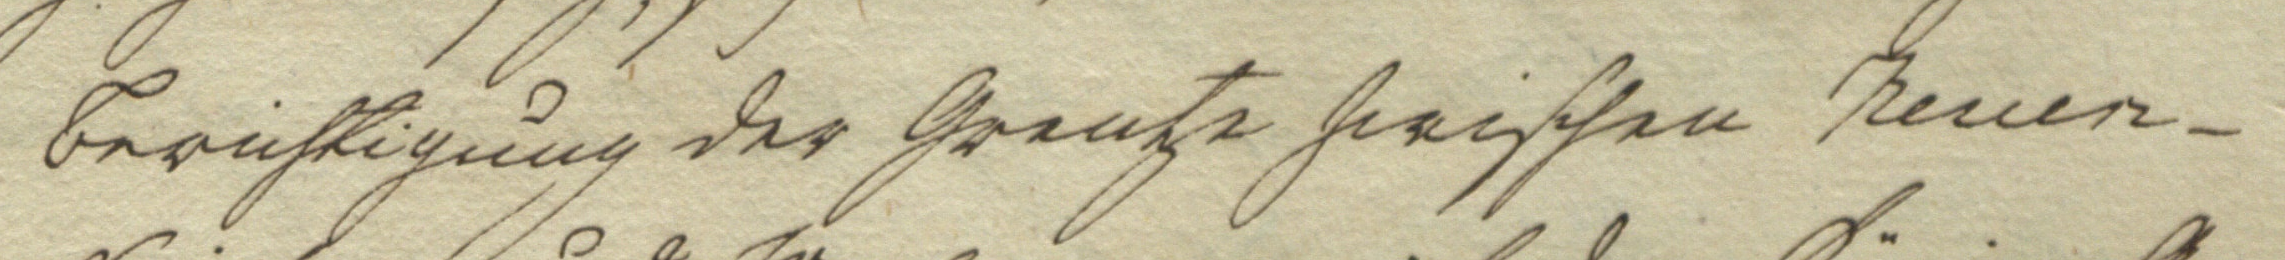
Berichtigung der Grentze zwischen Neuen¬
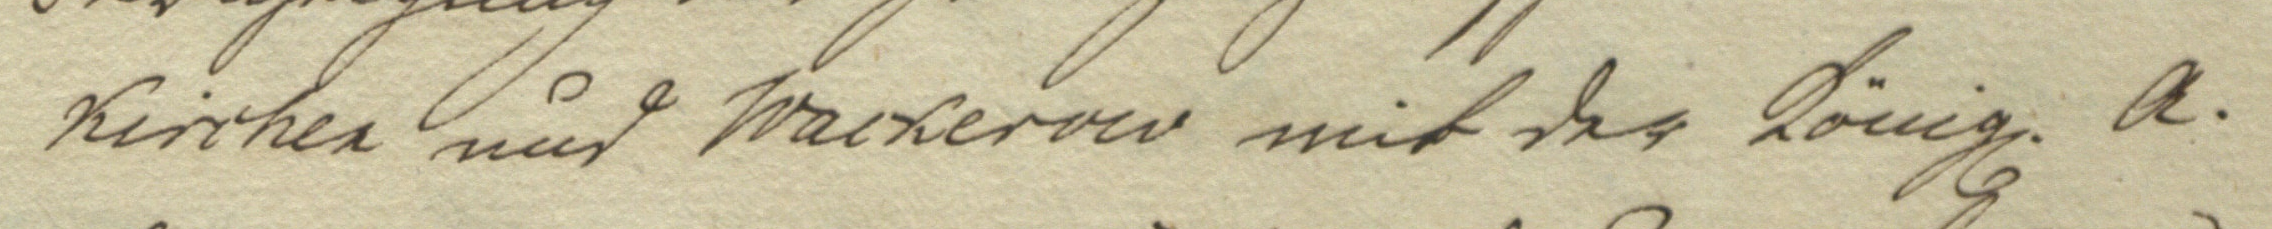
Kirchen und Wackerow mit der Königl. A¬
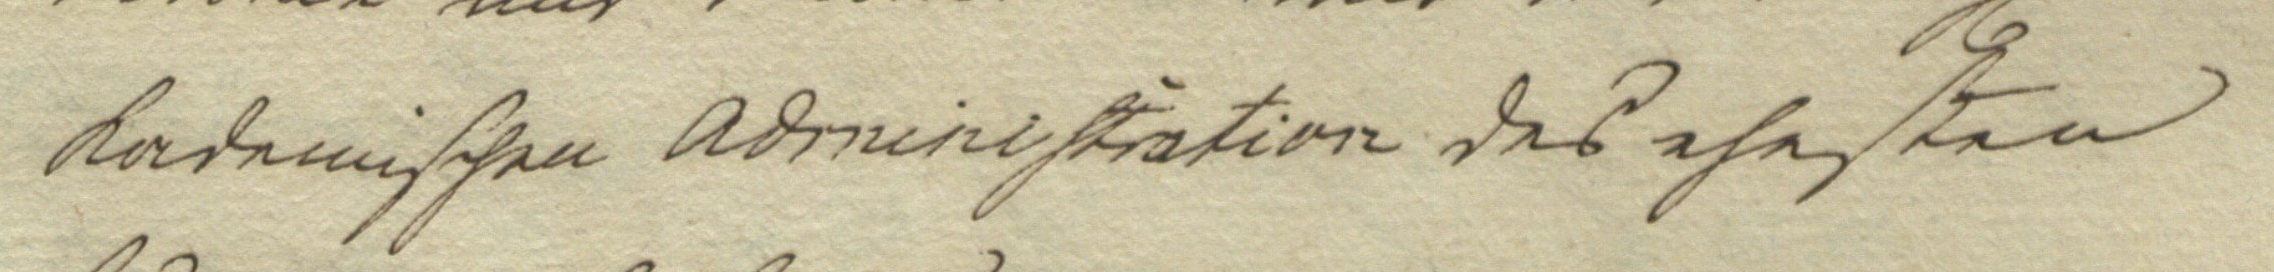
kademischen Administration des ehesten
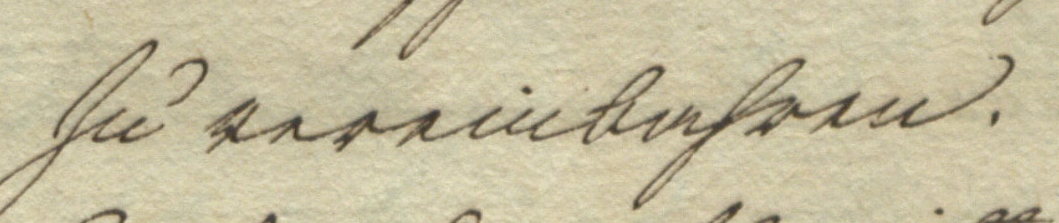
zu vereinbahren.
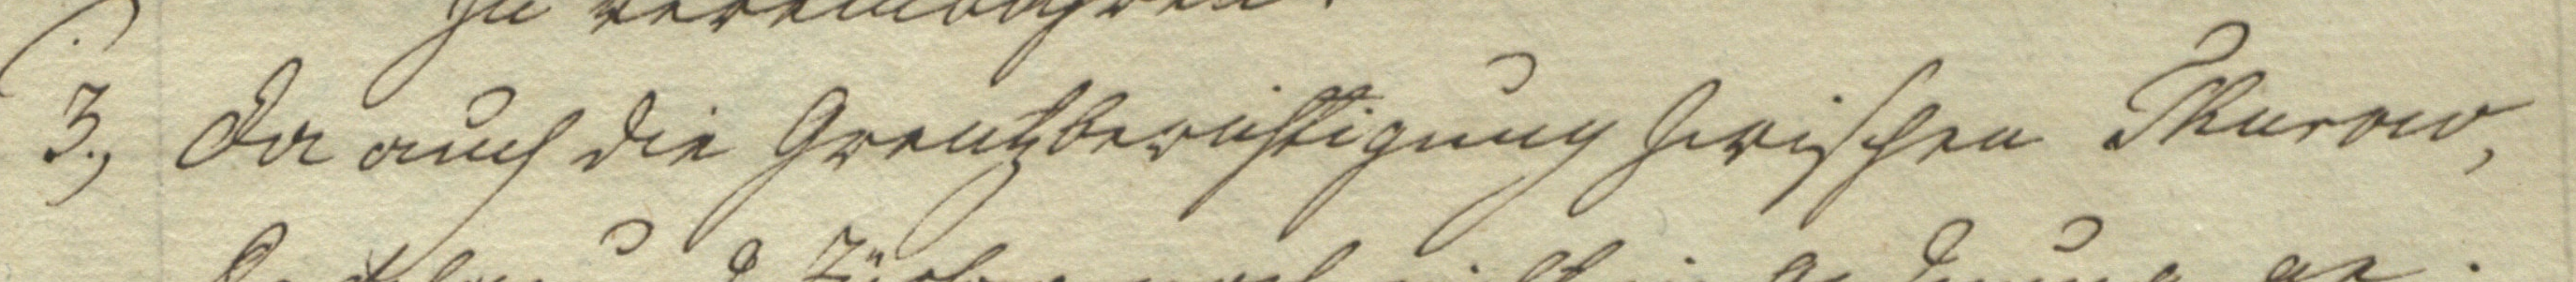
3., Da auch die Grentzberichtigung zwischen Thurow,
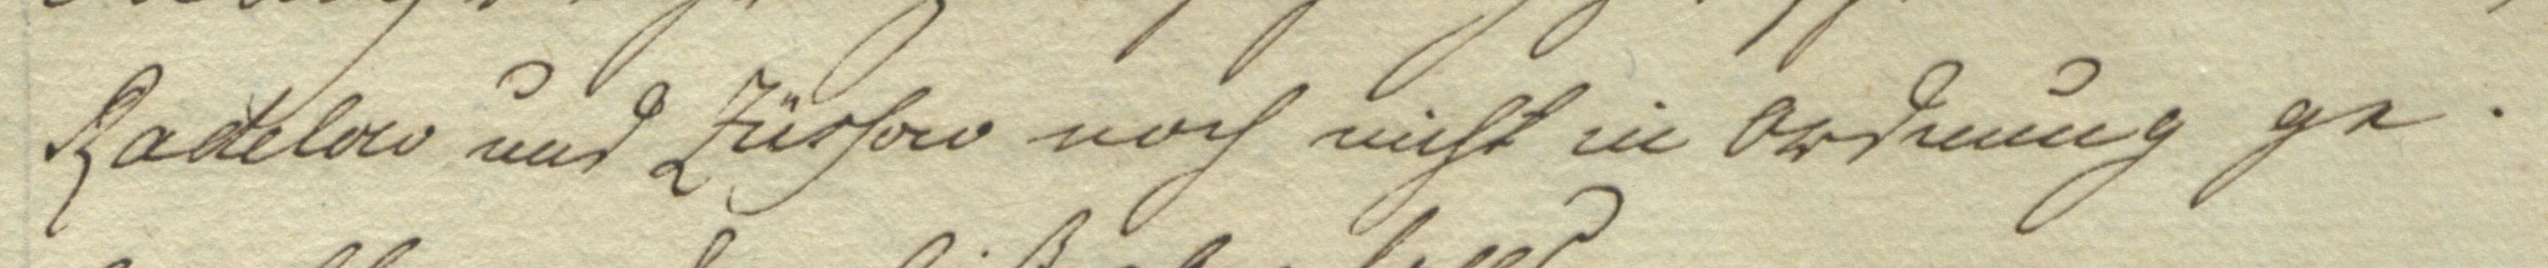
Radelow und Züssow noch nicht in Ordnung ge¬
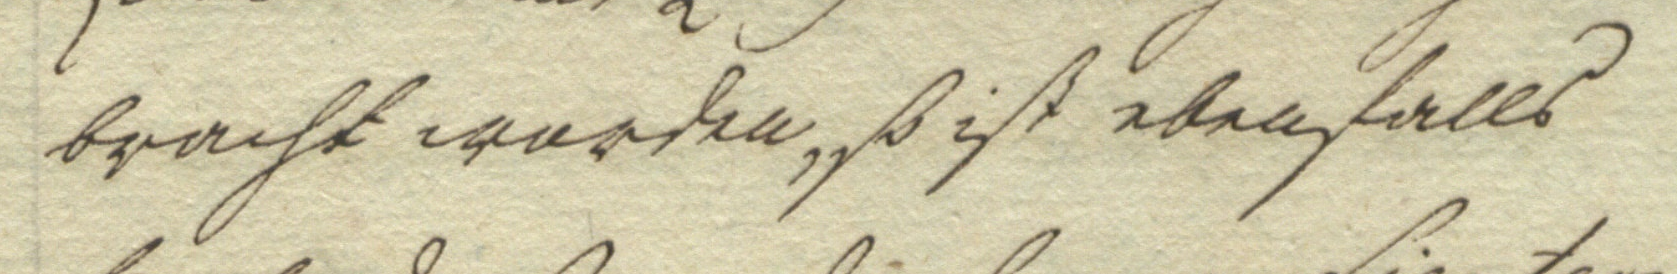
bracht worden, so ist ebenfalls
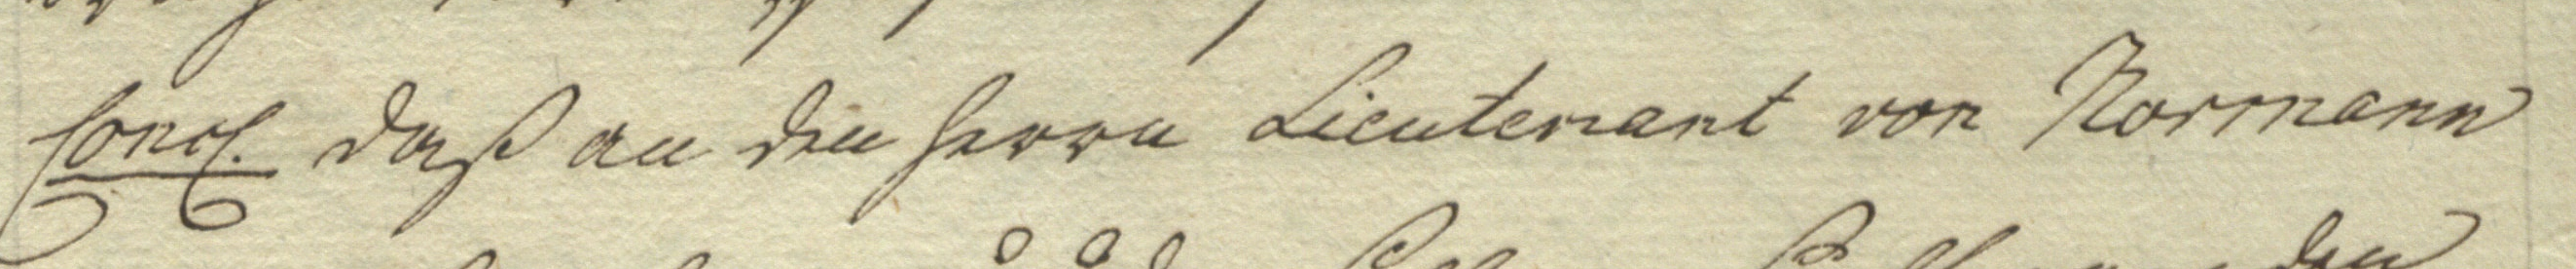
Concl. daß an den Herrn Lieutenant von Normann
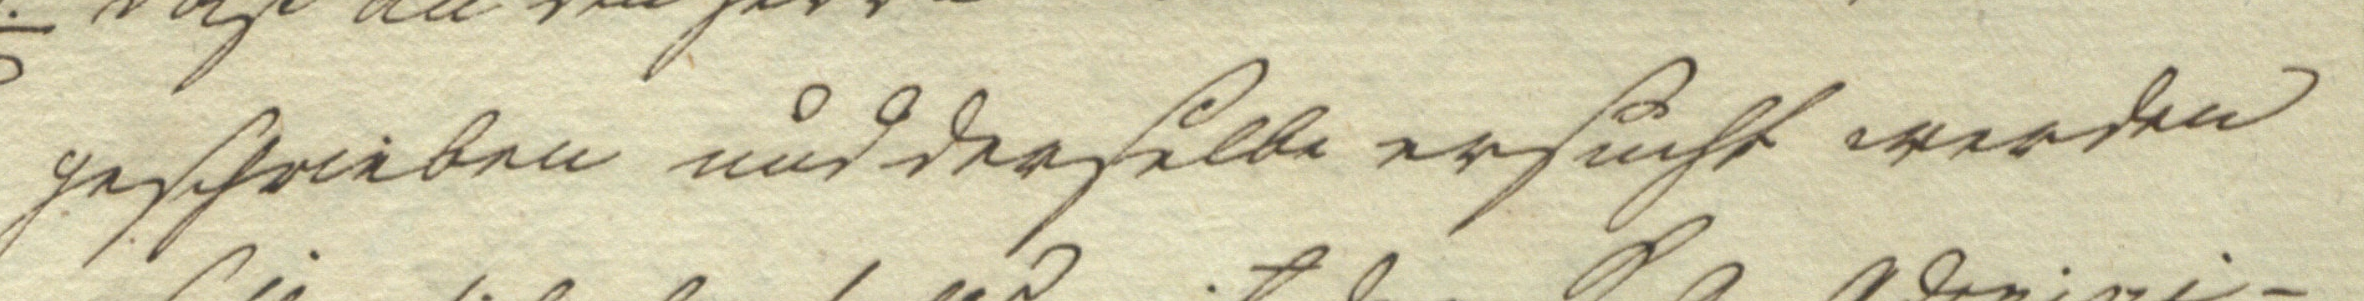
geschrieben und derselbe ersucht werden
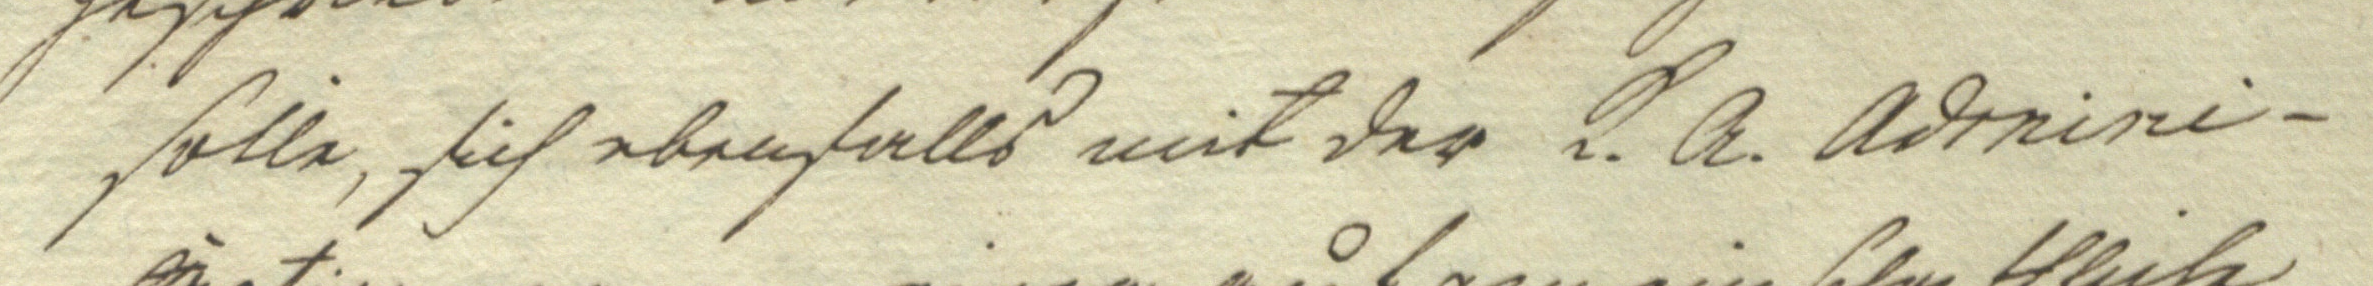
solle, sich ebenfalls mit der K. A. Admini¬
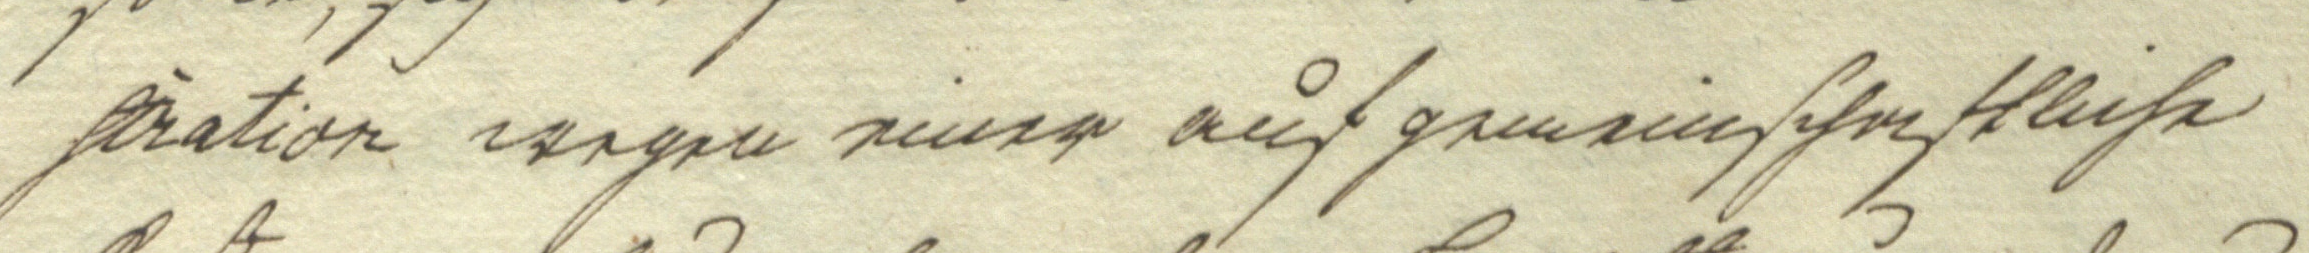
stration wegen einer auf gemeinschaftliche
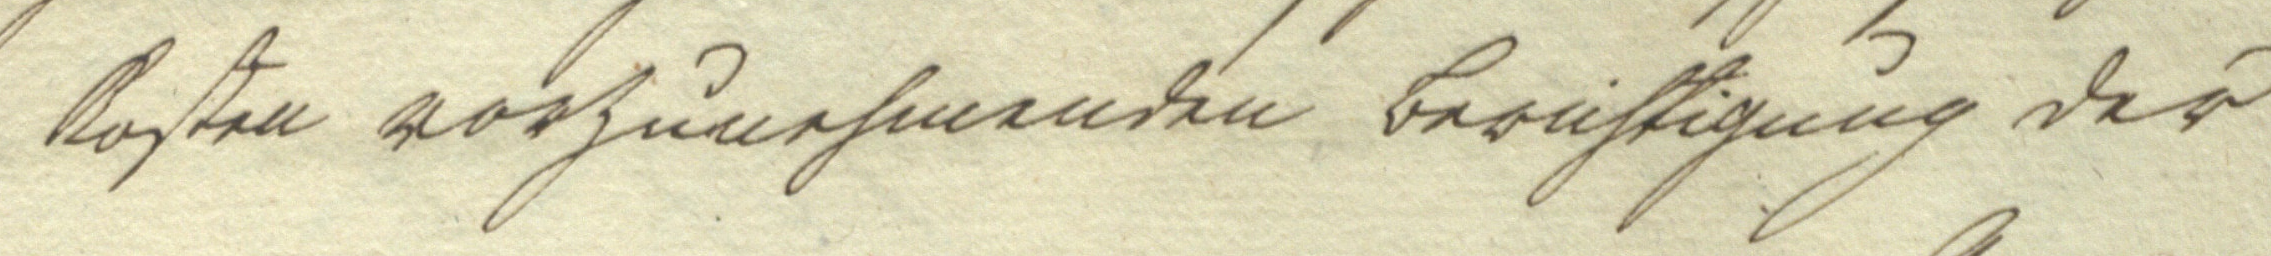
Kosten vorzunehmenden Berichtigung der
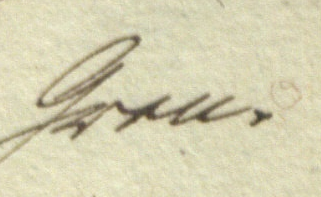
Gren¬
